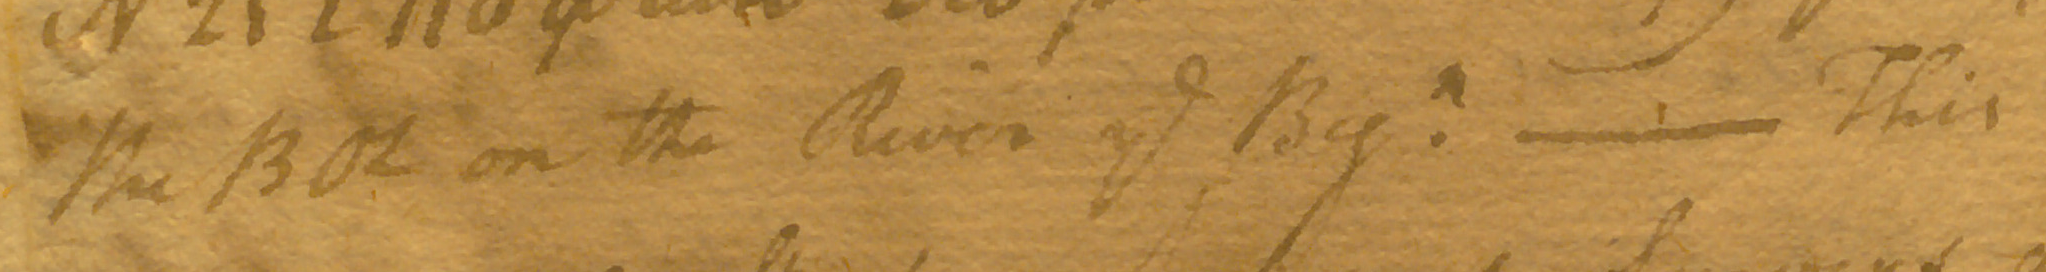the B 0h on the River y^e Bg^n.- This
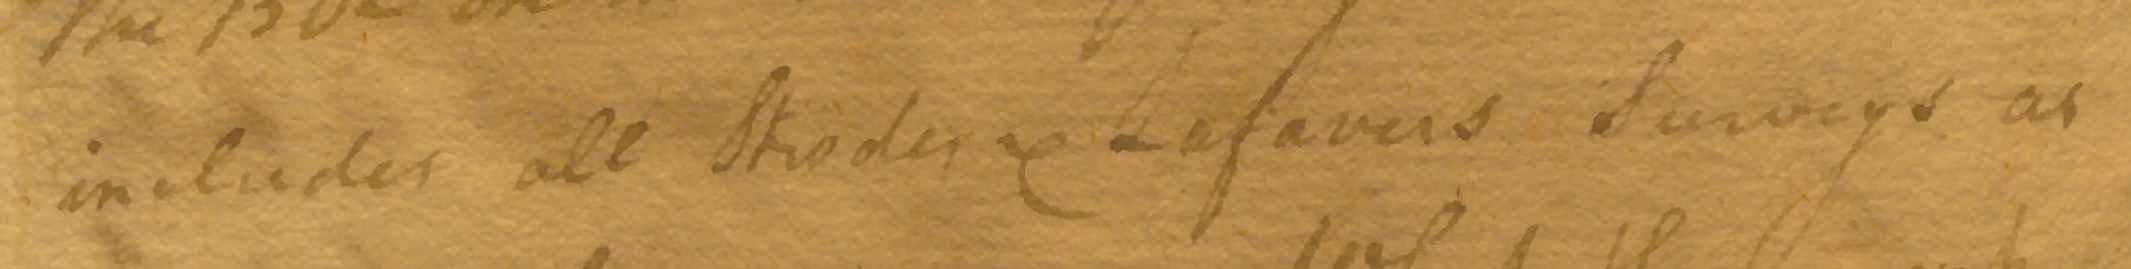includes all Strodes & Lafavers Surveys as
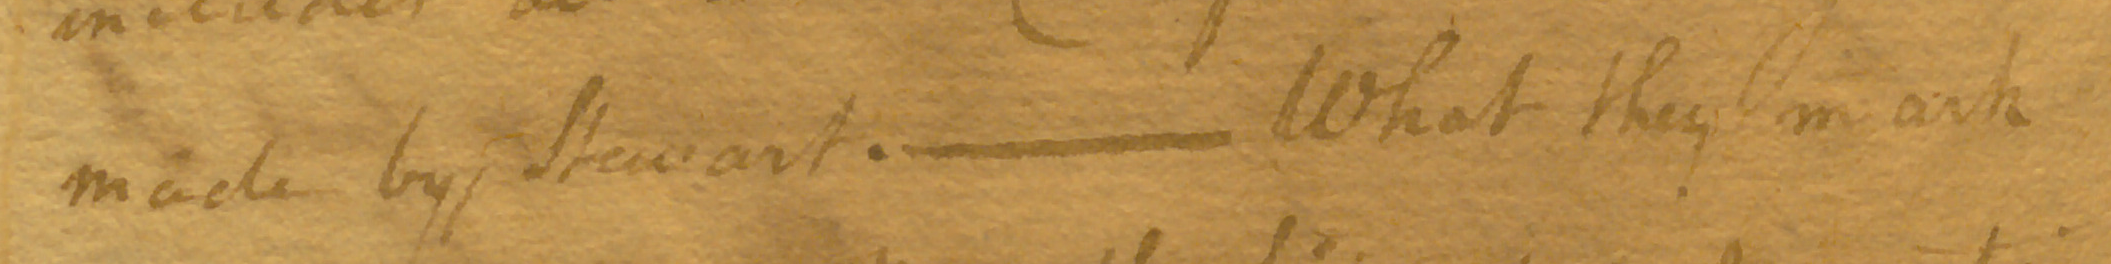made by Stewart.- What they mark
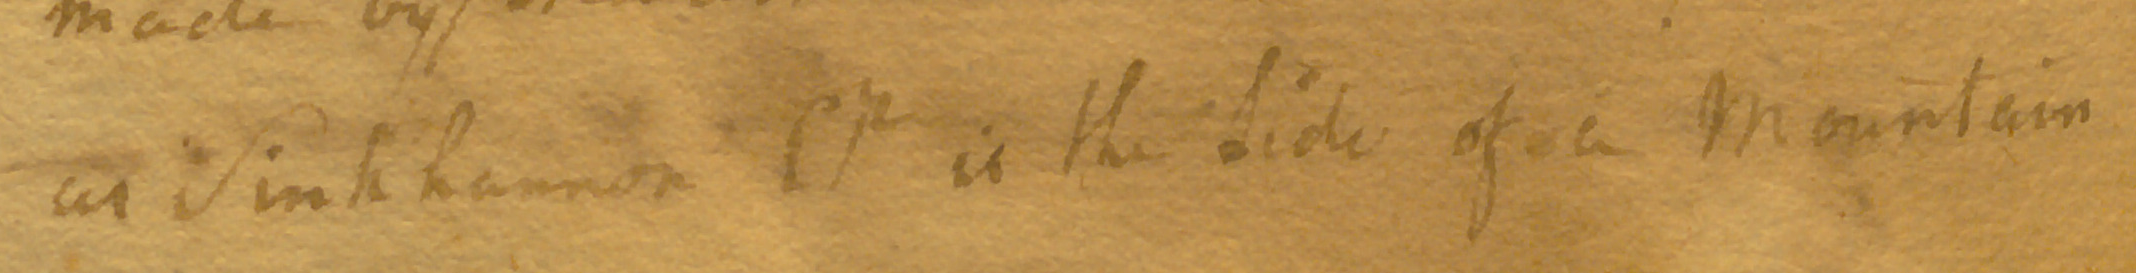as Sinkhammon C^r is the side of a mountain
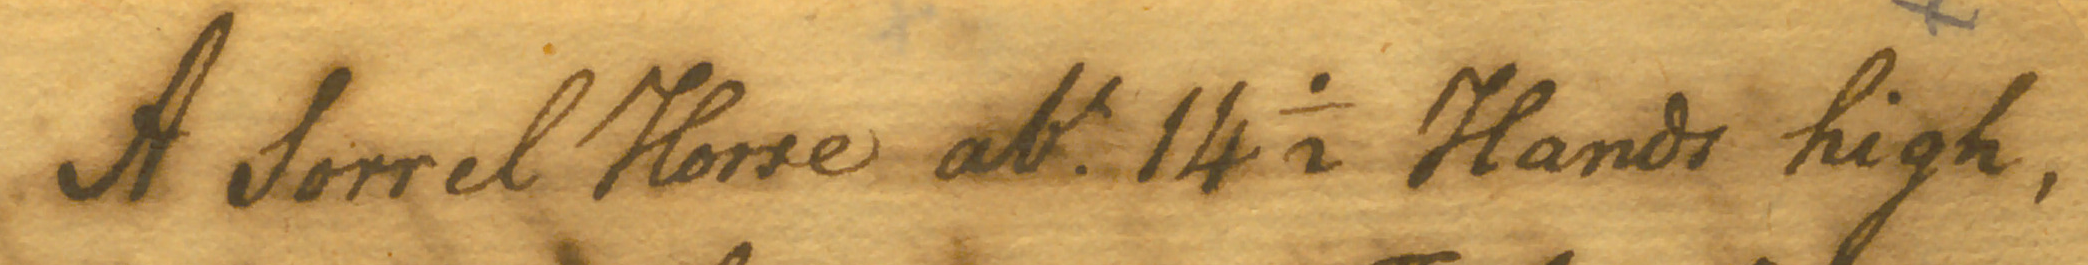A Sorrel Horse ab^t. 14 1/2 Hands high,
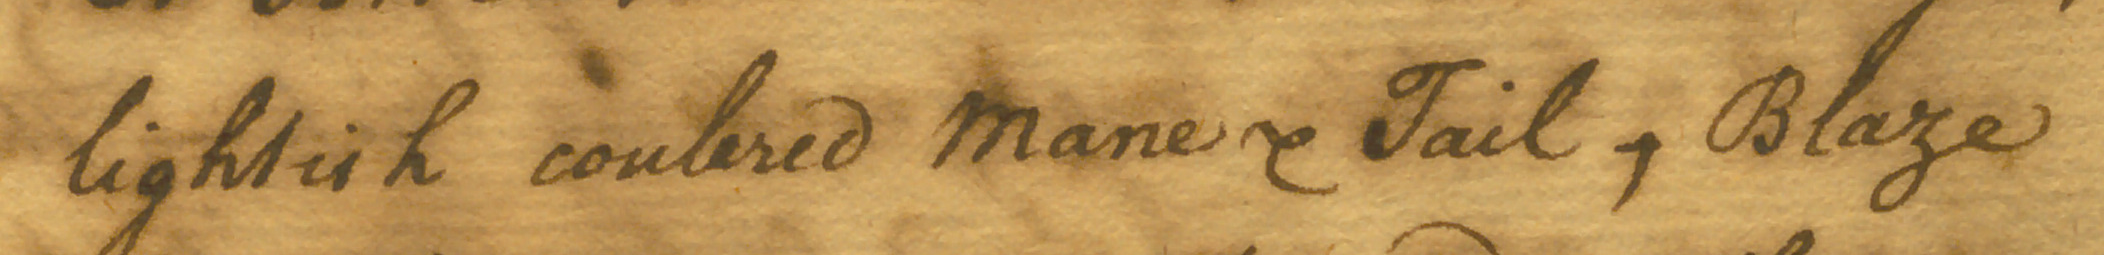lightish coulered Mane & Tail, Blaze
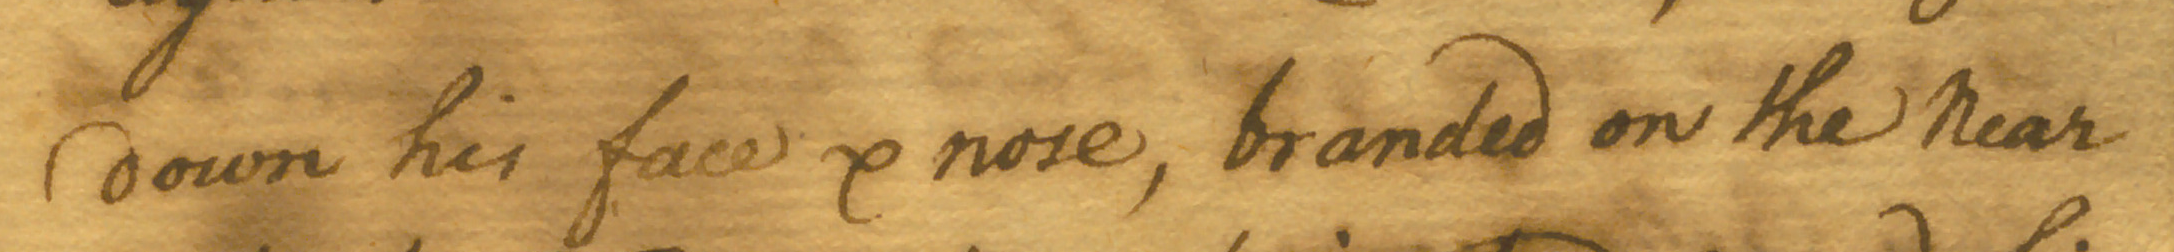down his face & nose, branded on the near
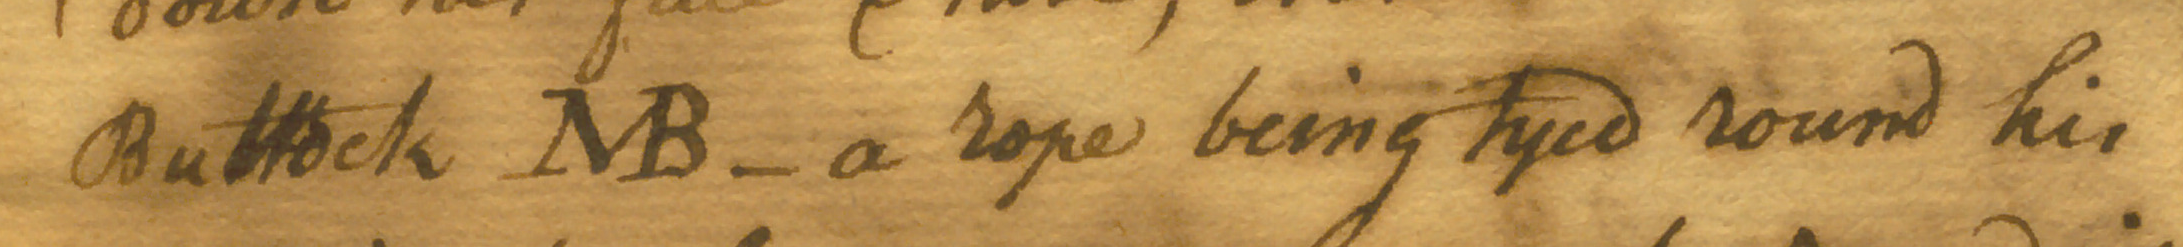Buttock NB- a rope being tyed round his
